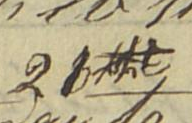26^th
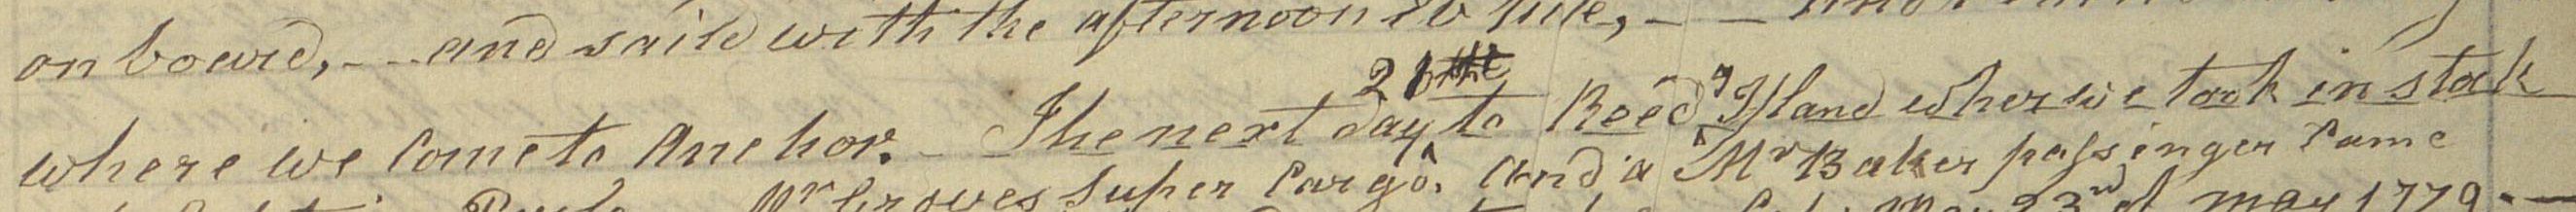where we Come to anchor: The next day ^ to Reed ^ I land wher we took in stock
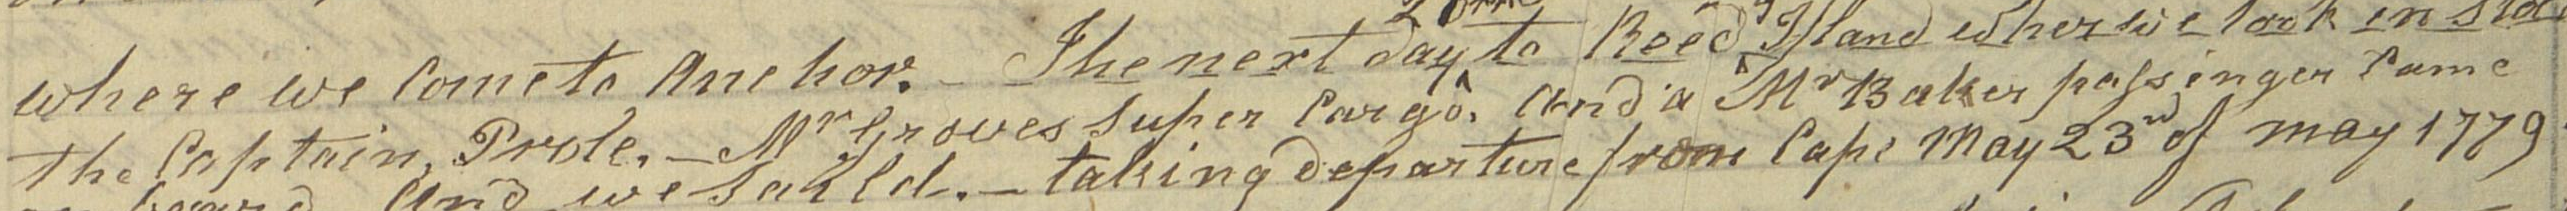the Captain Prole. M^r Groves Super Cargo, And a M^r Baker passenger Came
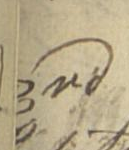3^rd
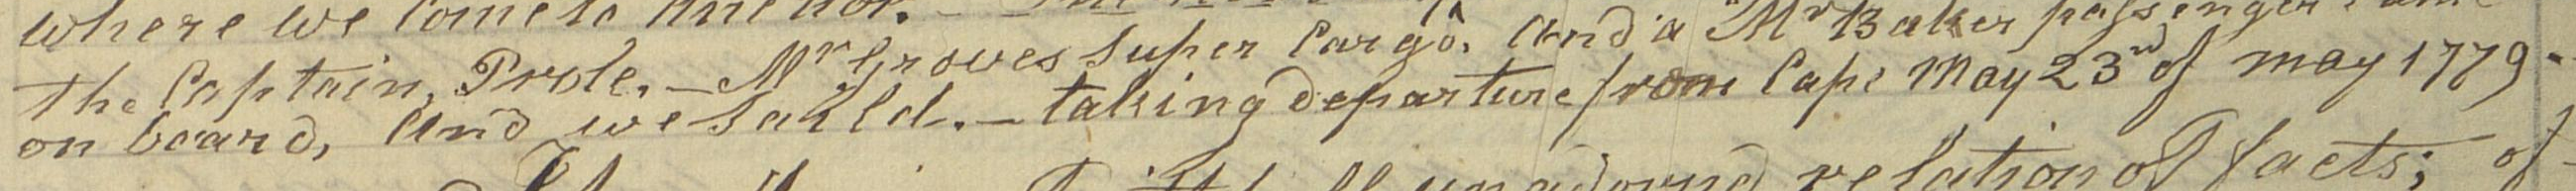on board, And we Saild. taking departure from Cape May 23^rd of may 1779.
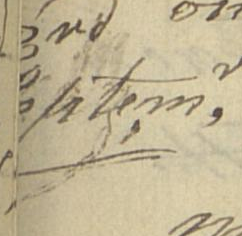Septem^r
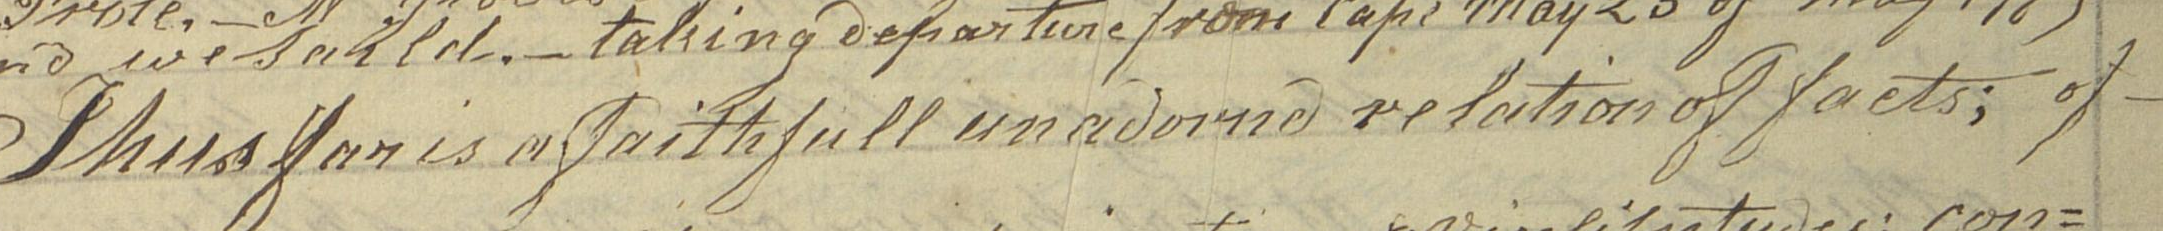Thus far is a faithfull unadornd relation of facts; of
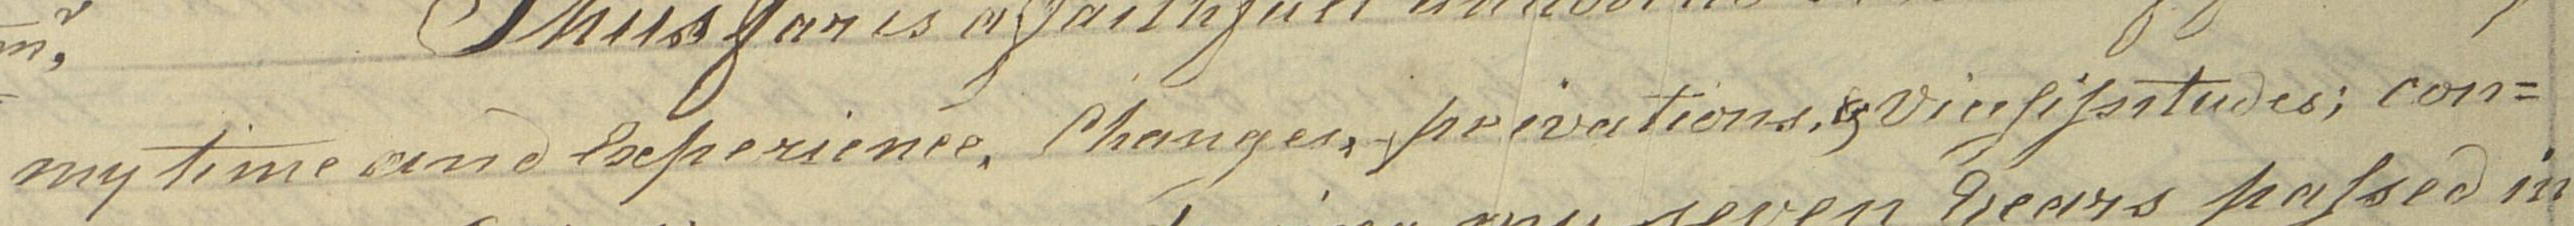my time and Experionce, Changes, privations, & vicisissitudes; con-
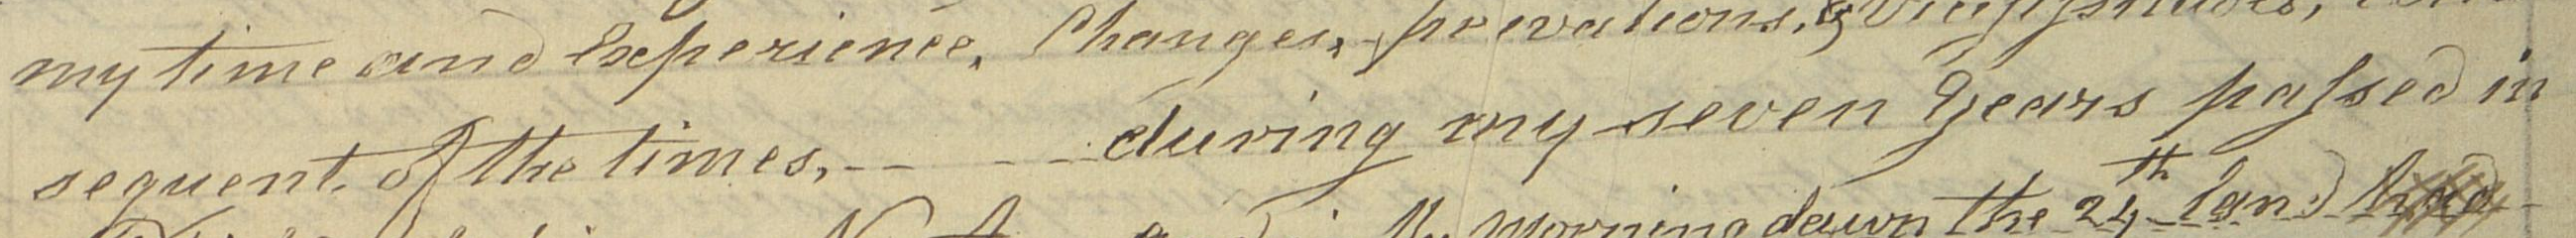sequent of the times. during my seven years passed in
